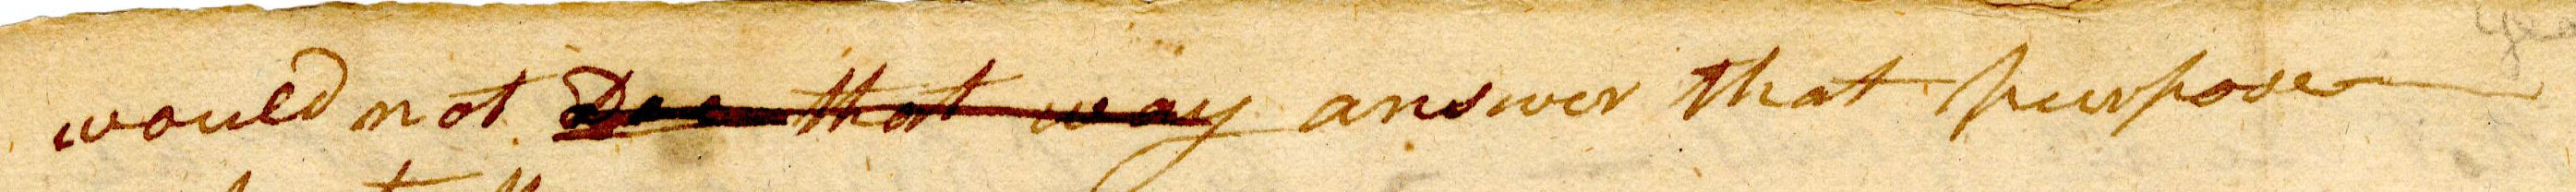would not [___] [that way] answer that purpose-
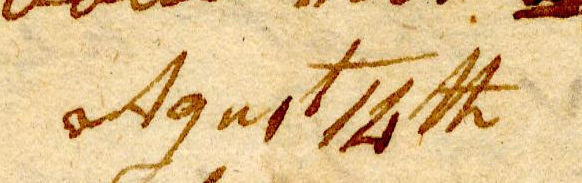Agust 14th
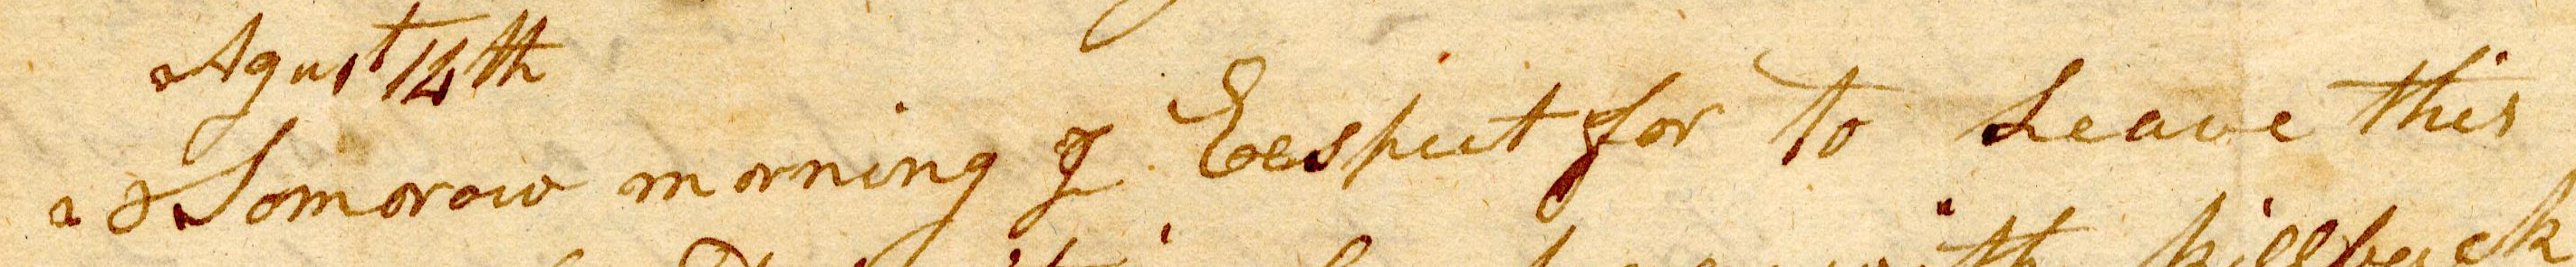Tomorow morning I Ecspect for to Leave this
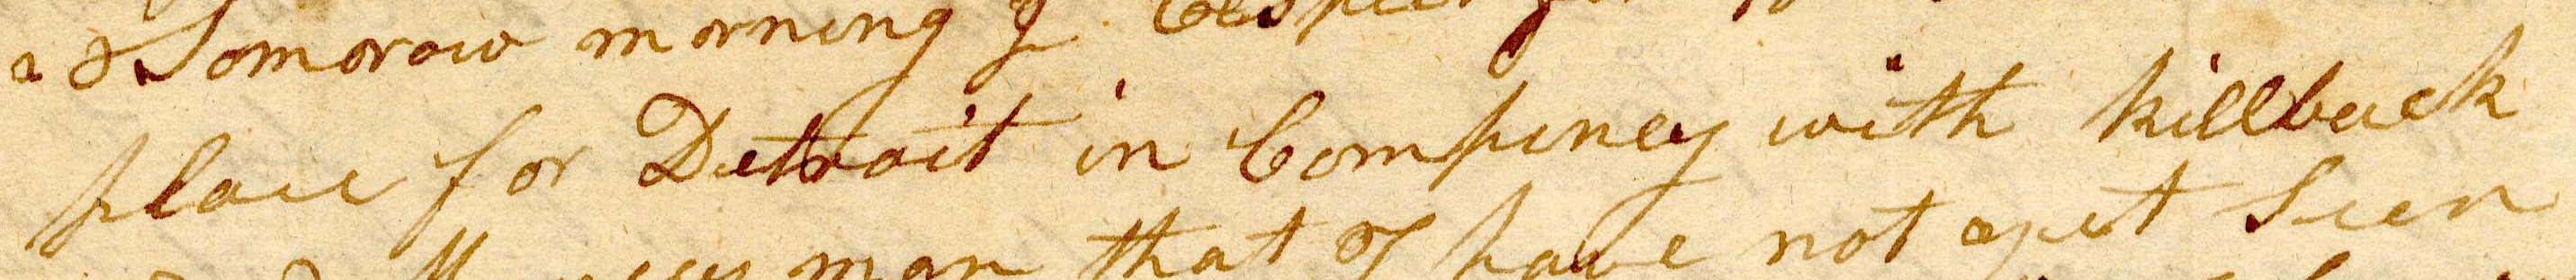place for Detroit in Compiney with killbuck
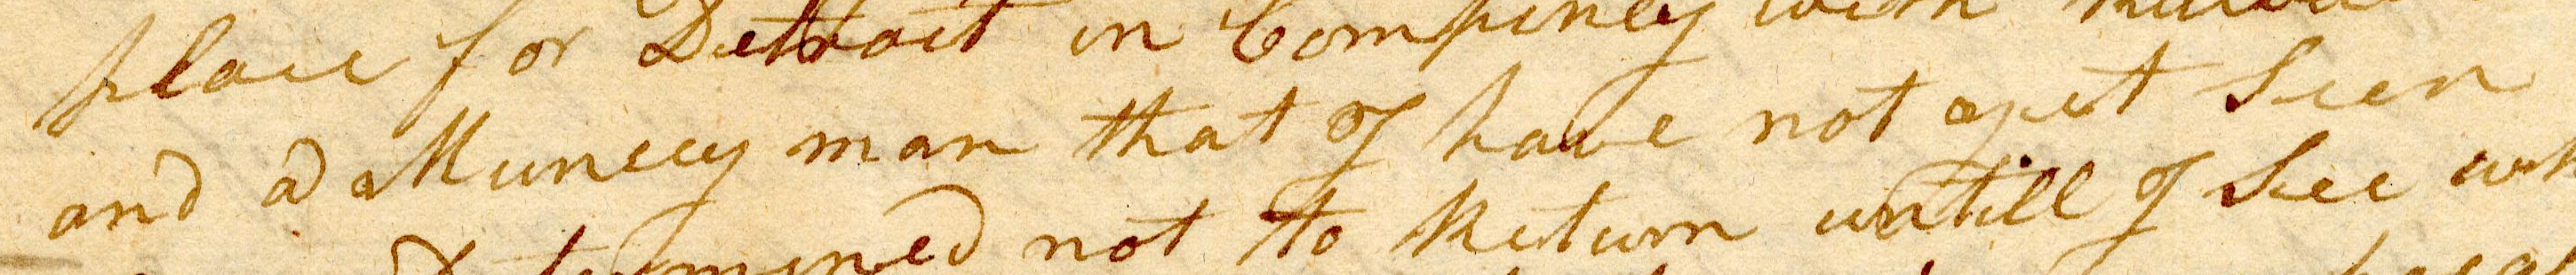and a Muncey man that of have not yet Seen
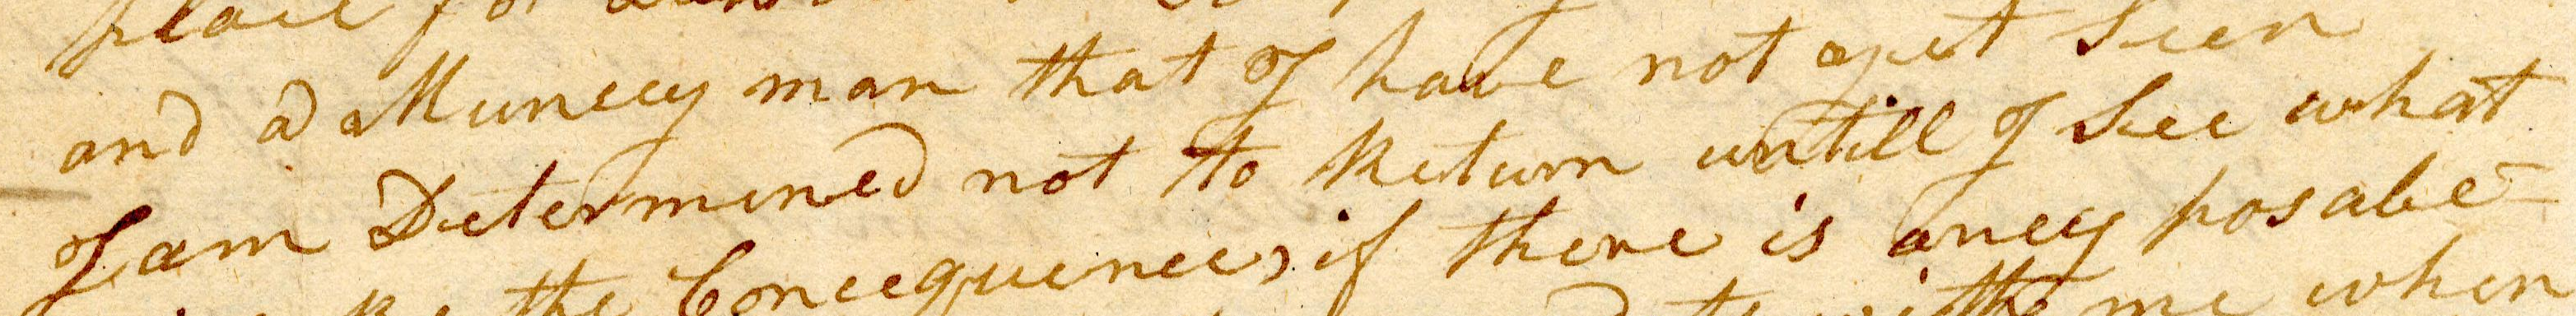I am Determined not to Return untill I see what
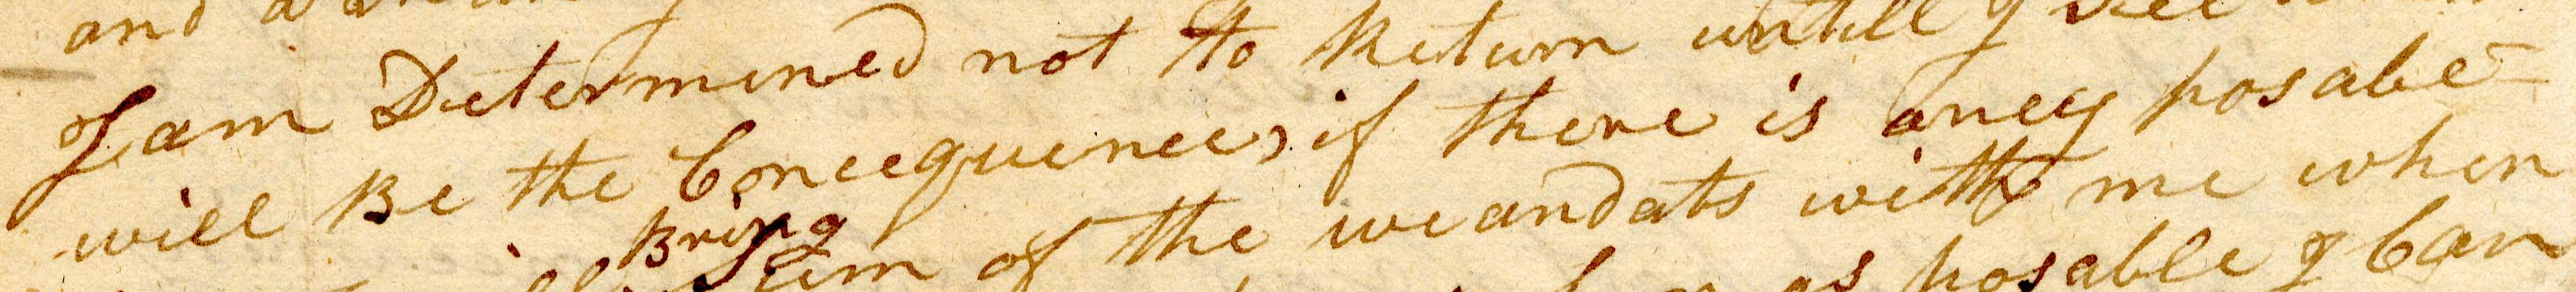will Be the Concequences if there is aney posabe-
